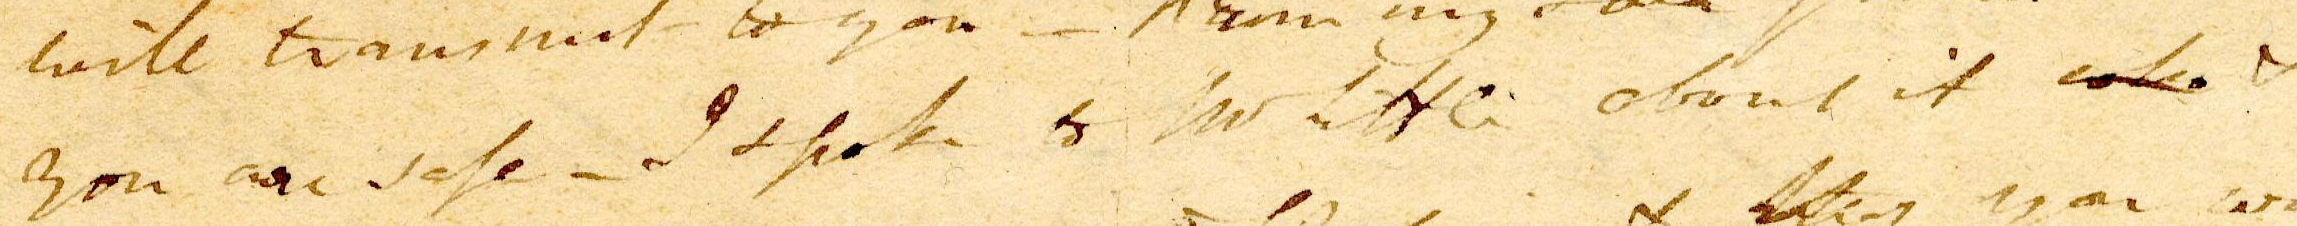You are safe. I spoke to M^r Litle about it who &
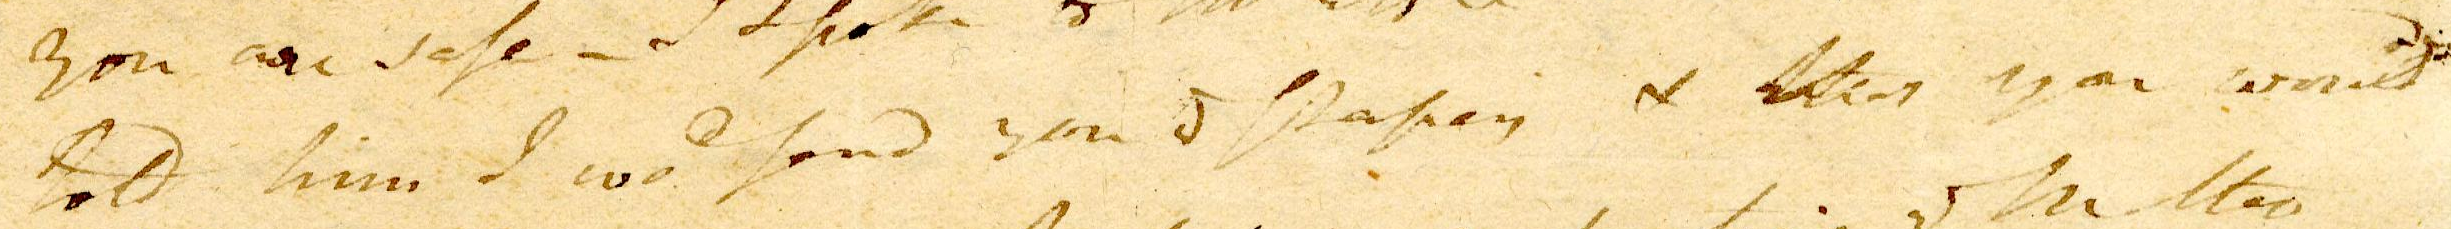told him I wo^d send you a Paper & that you would
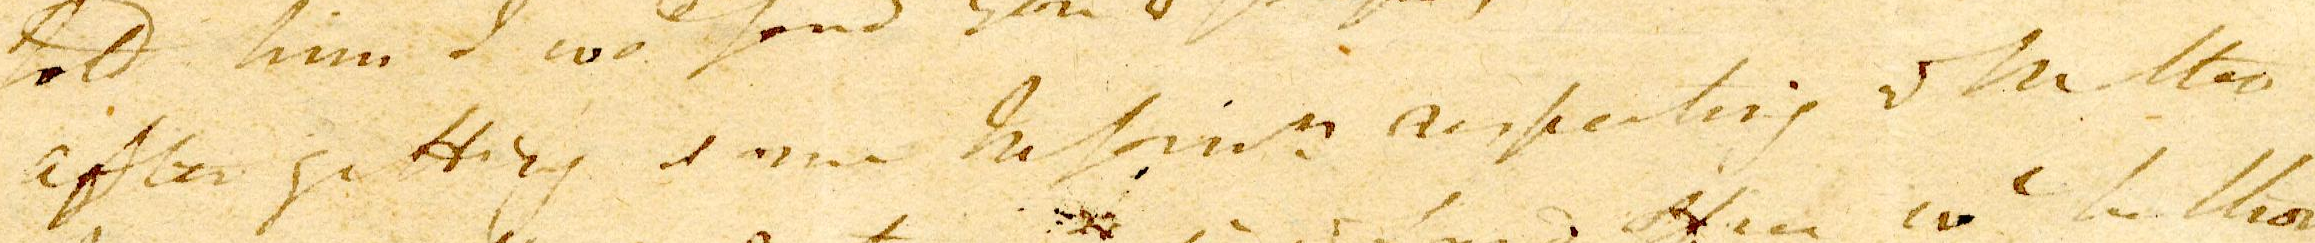after getting some Inform^n respecting y^e Matters
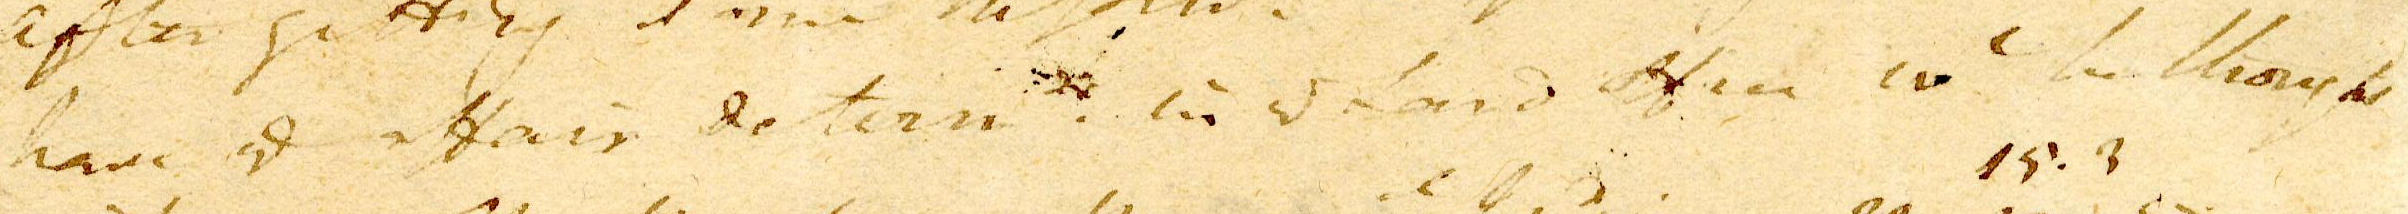have y^e affair return in y^e Land affair w^h he thought
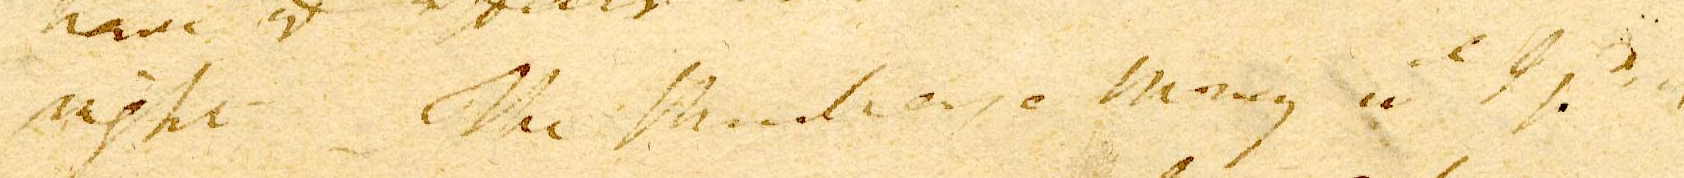right. The Mortage Money is p^d.
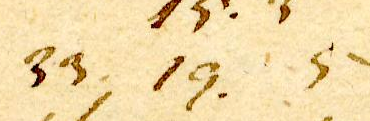33.19.5
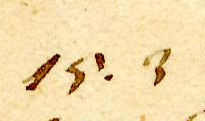15.3
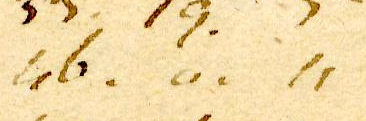46. 0. 11
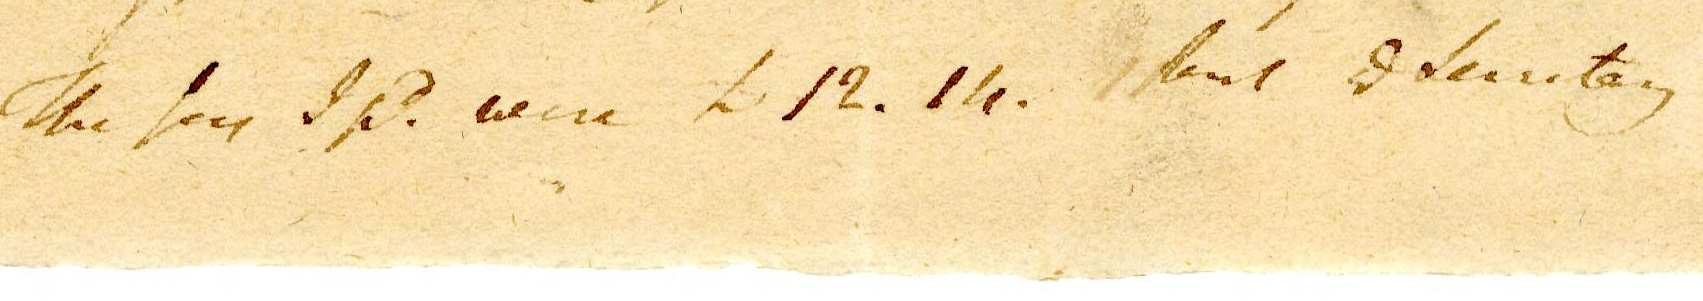The fees I p^d. were £12.14 but surety
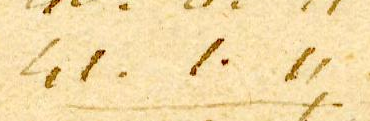41. 1 . 11
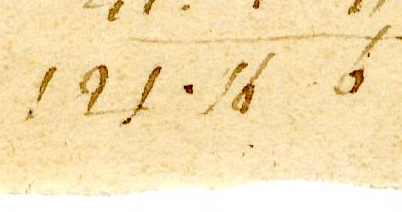191. 16. 6
